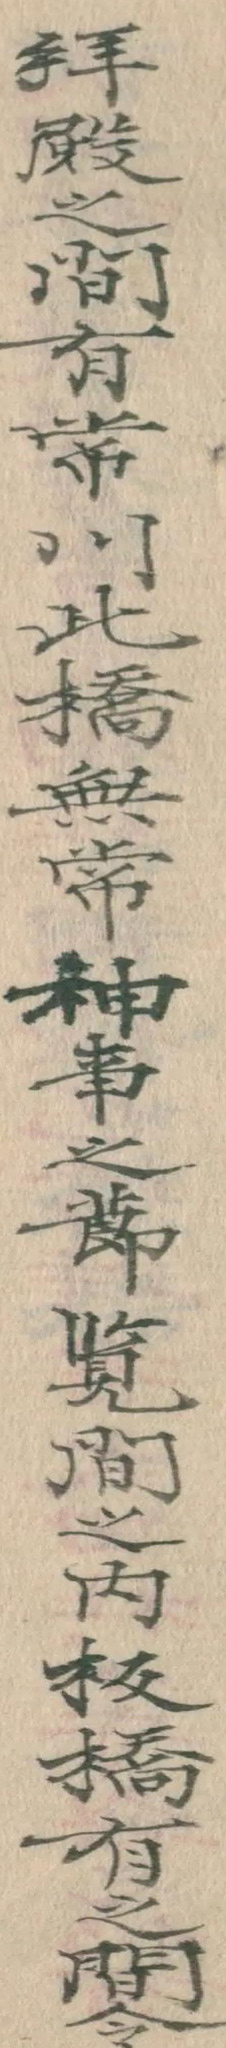拝殿之間有常川此橋無常神事之節覧間之内板橋有之間令
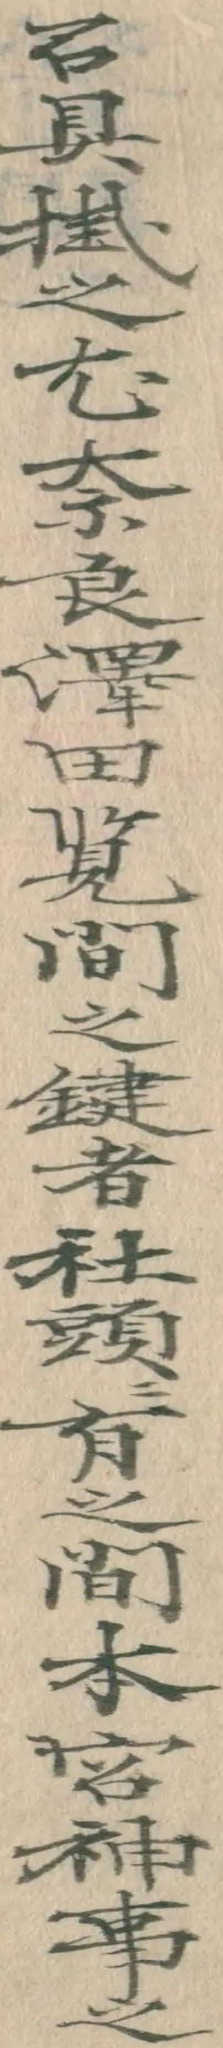召具掛之尤奈良沢田覧間之鍵者社頭ニ有之間本宮神事之
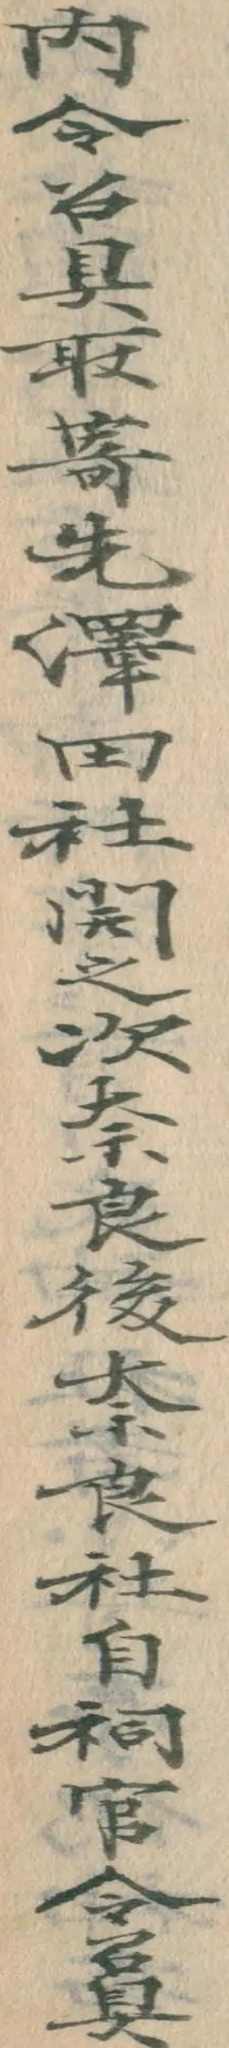内令召具取寄先沢田社開之次奈良後奈良社自祠官令召具

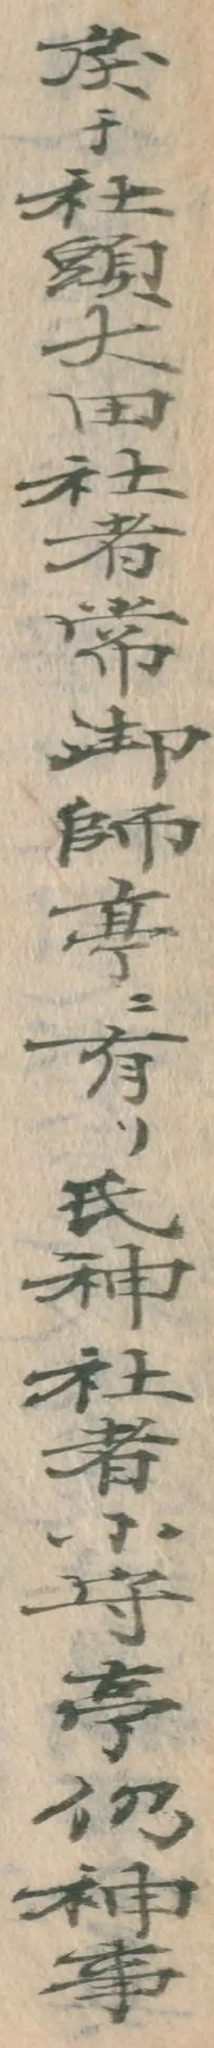戻于社頭大田社者常御師亭ニ有リ氏神社者小守亭仍神事
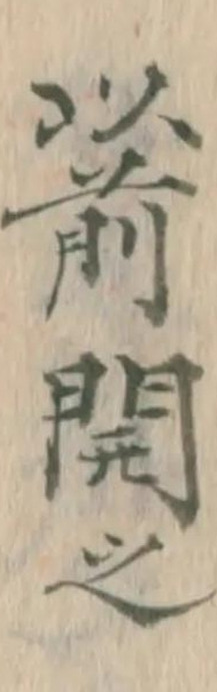以前開之
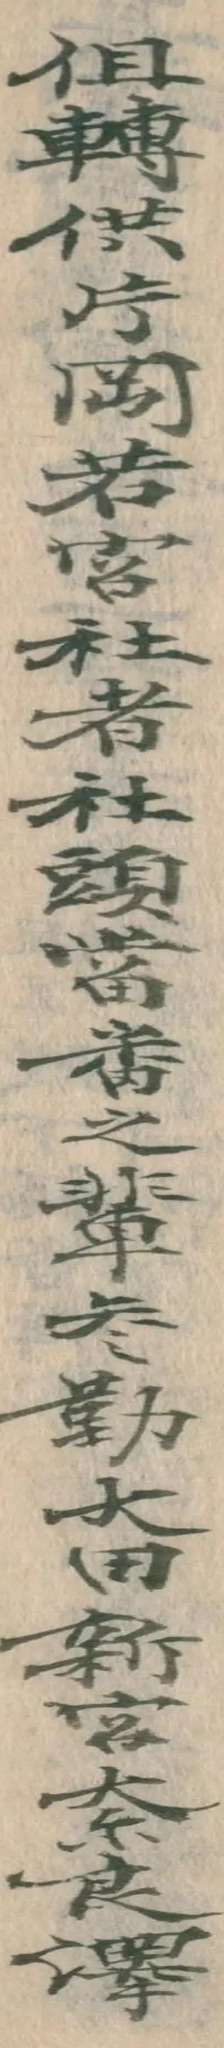但転供片岡若宮社者社頭当番之輩参勤大田新宮奈良沢
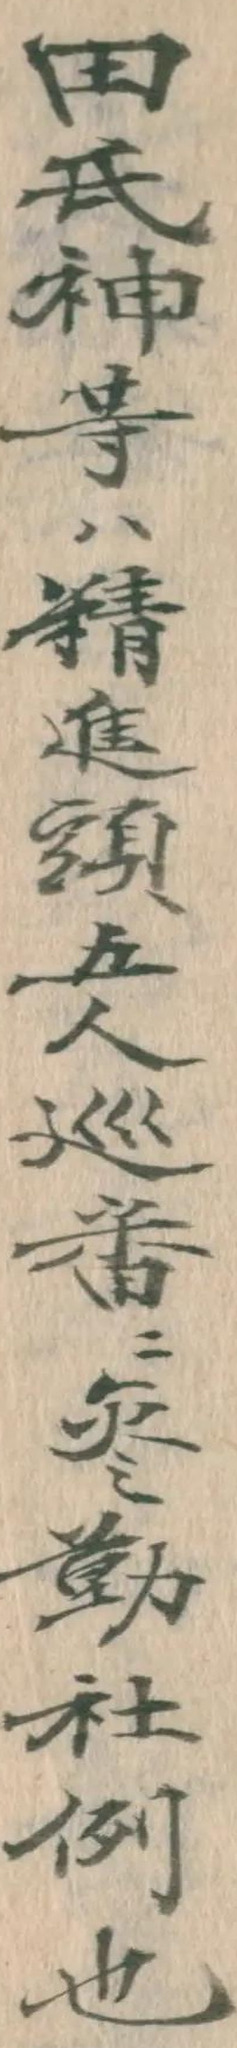田氏神等ハ精進頭五人巡番ニ参勤社例也
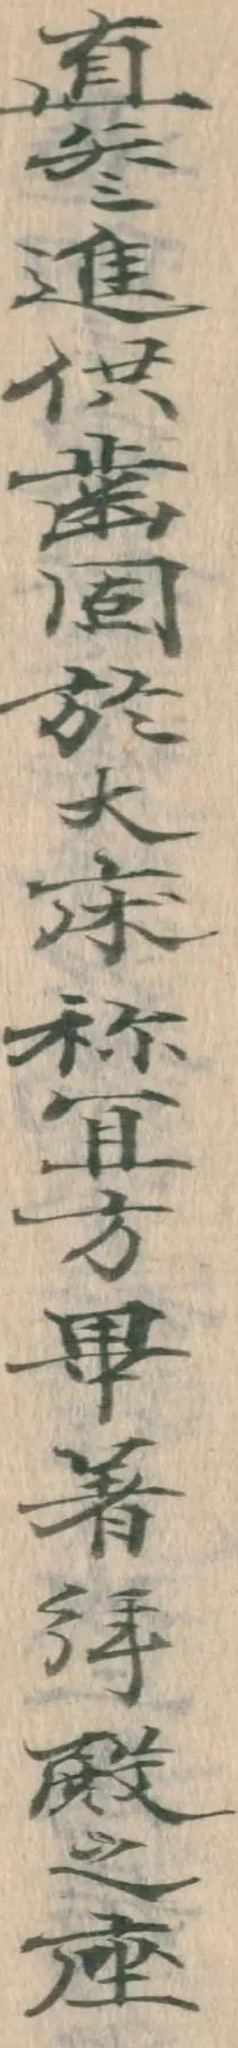直参進供歯固於大床称宜方畢着拝殿之座
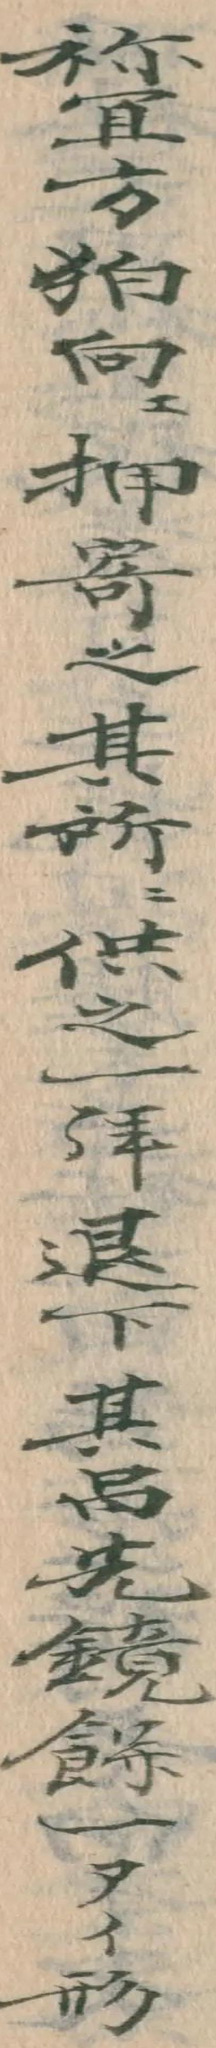祢宜方狛向エ押寄之其所ニ供之一拝退下其品先鏡餅一アイ形
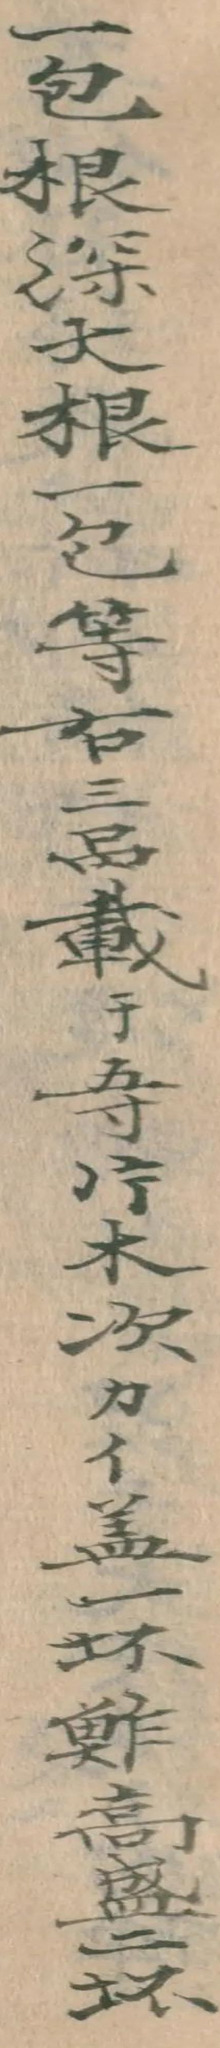一包根深大根一包等右三品載于五寸片木次カイ盖一坏鮓高盛二坏
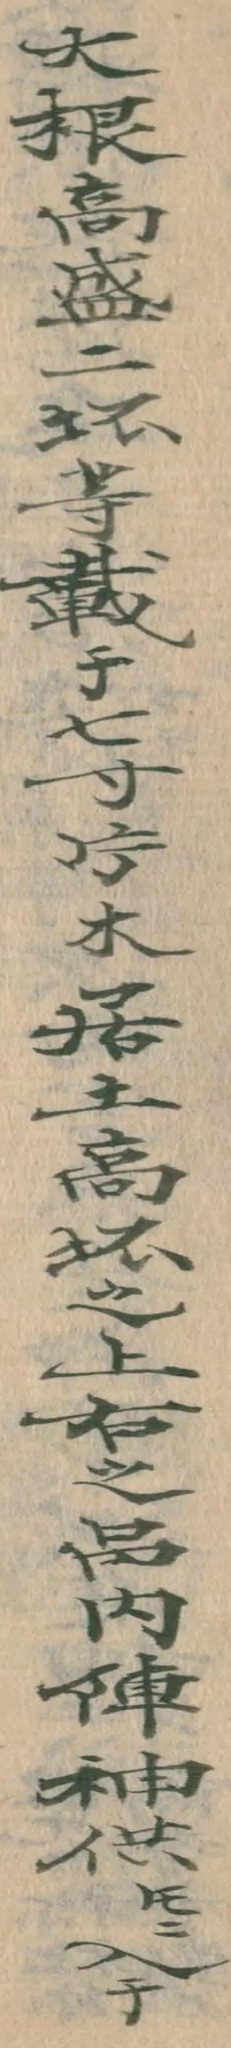大根高盛二坏等載于七寸片木居土高坏之上右之品内陣神供トモニ入于
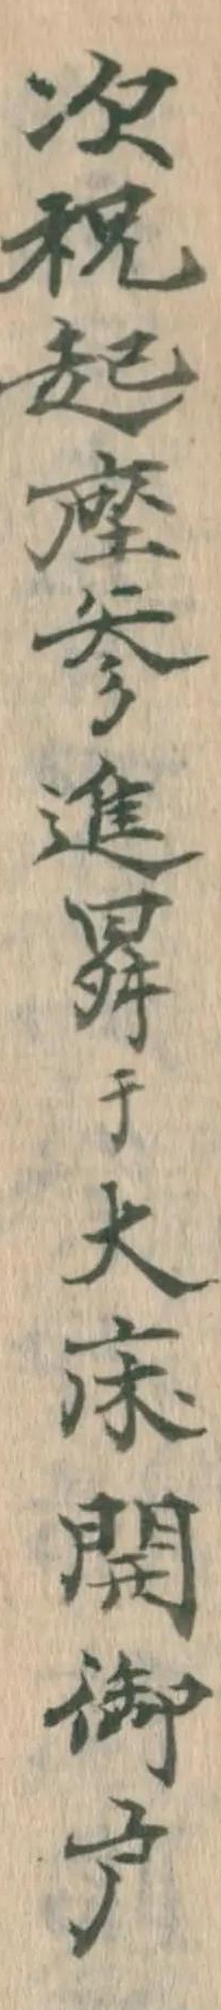次祝起座参進昇于大床開御戸
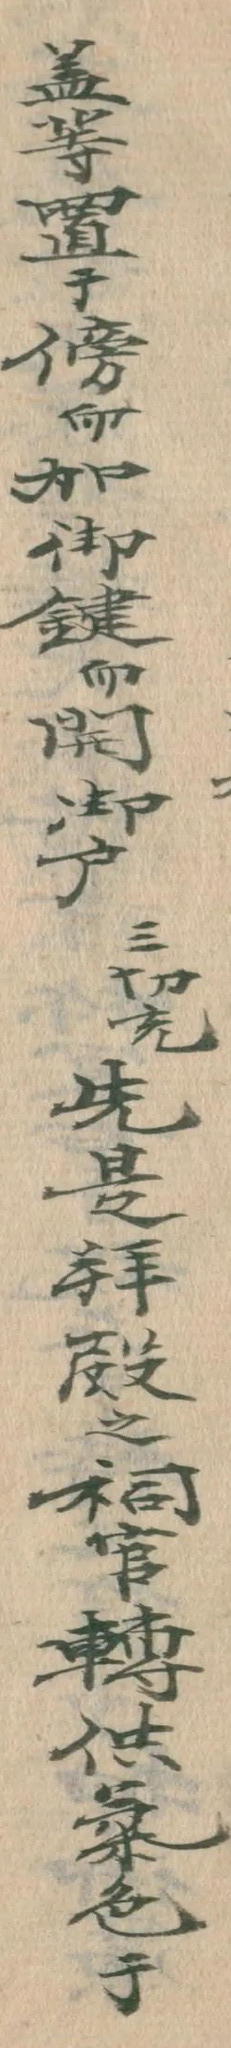盖等置于傍而加御鍵而開御戸三切充先是拝殿之祠官転供気色于
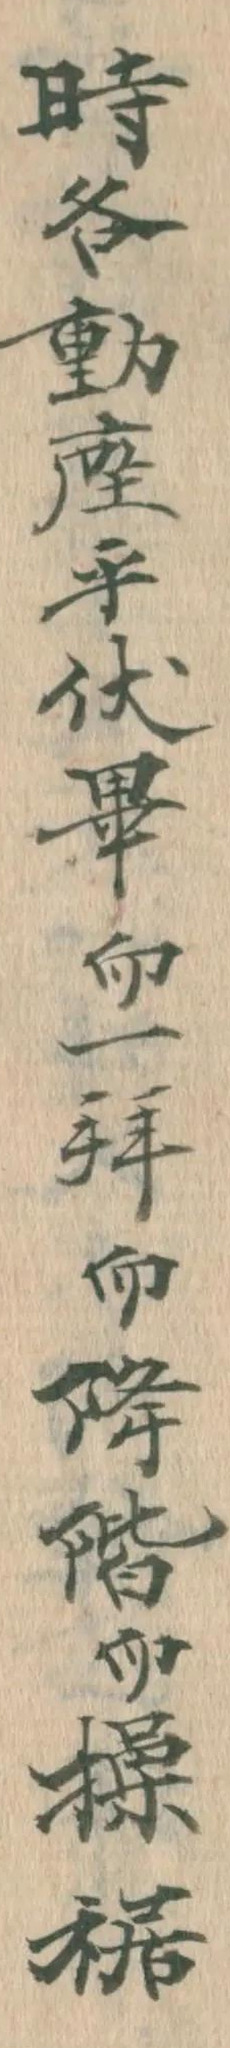時各動座乎伏畢而一拝而降階而操裾
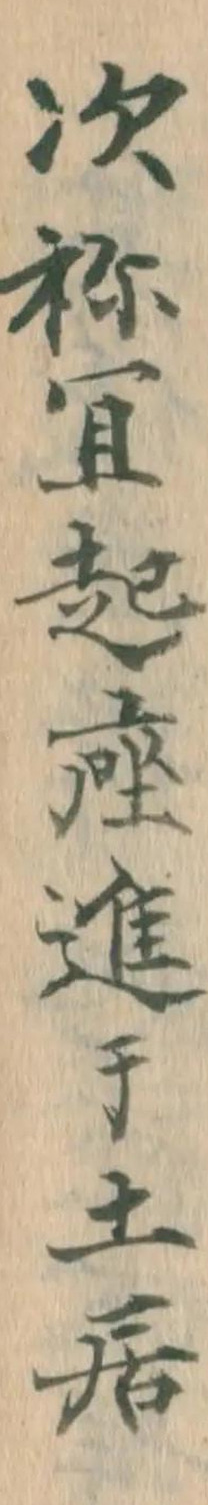次称宜起座進于土居

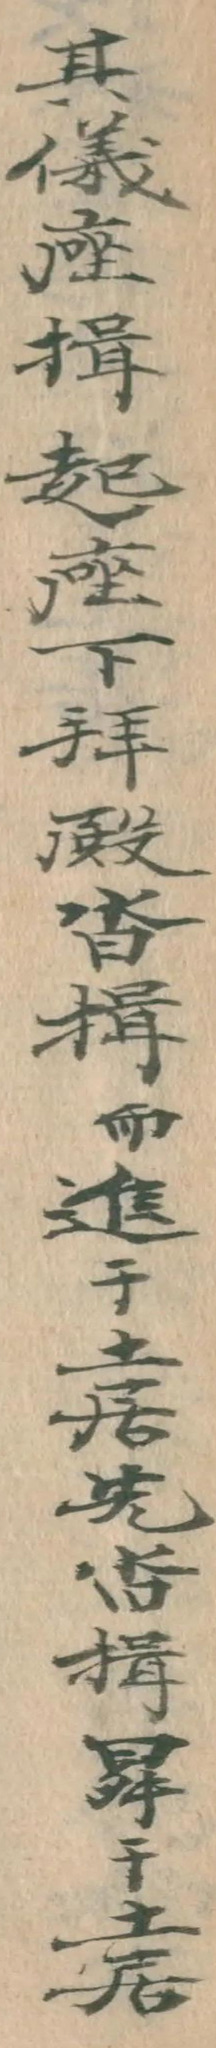其儀座揖起座下拝殿沓揖而進于土居先沓揖昇于土居
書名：賀茂社記録. 第9冊
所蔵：国立国会図書館 National Diet Library, JAPAN
